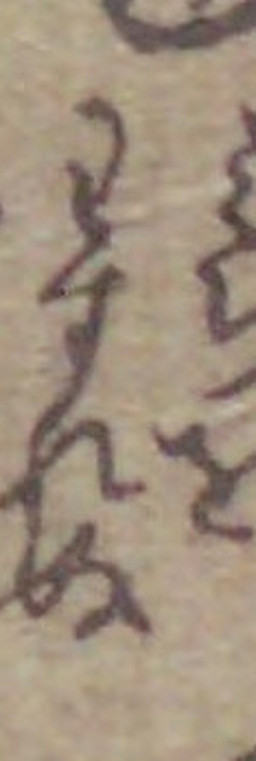わすれぬ
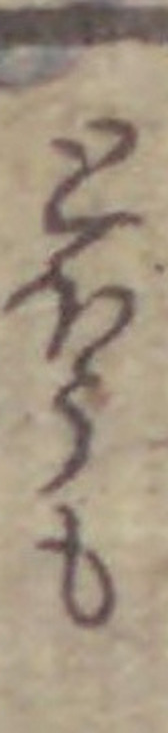とほうも
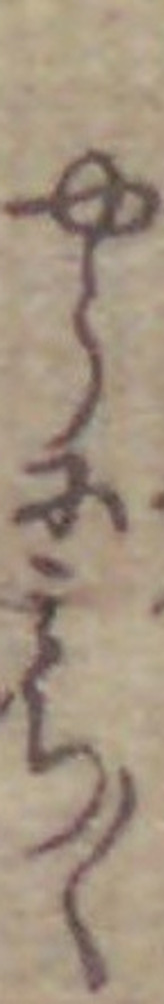やうにみち〳〵
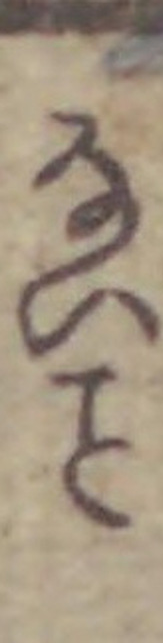ないこと
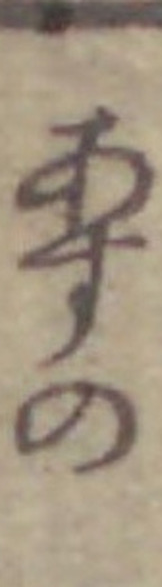あすの
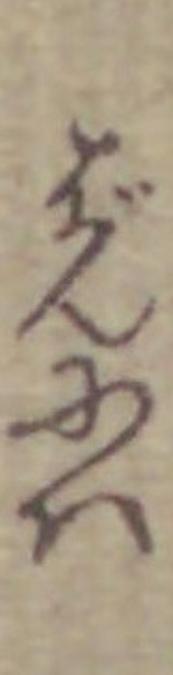ばんには
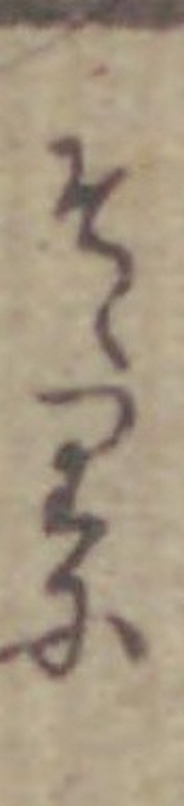そゝりに
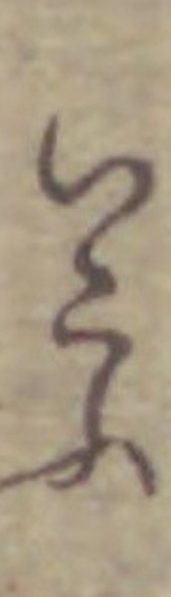いこふ
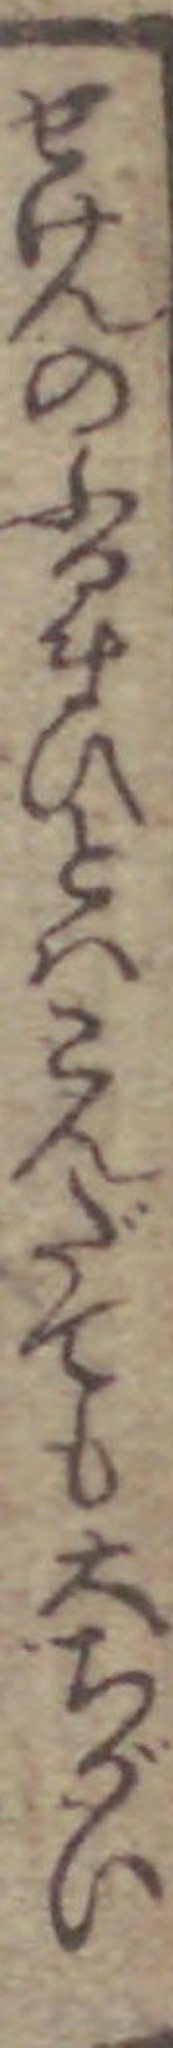せけんのふるまひとはこんだても大ちがい
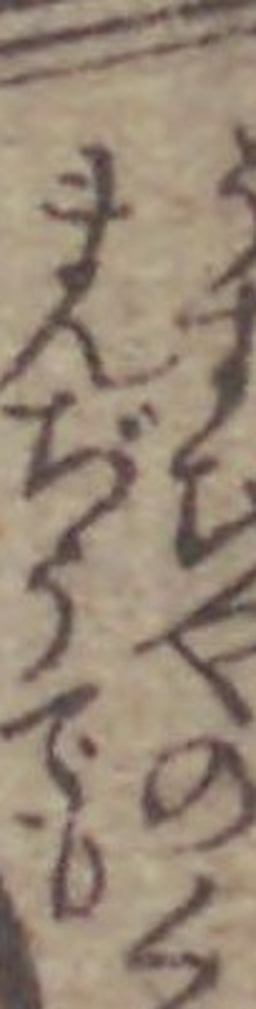まんぢうでも
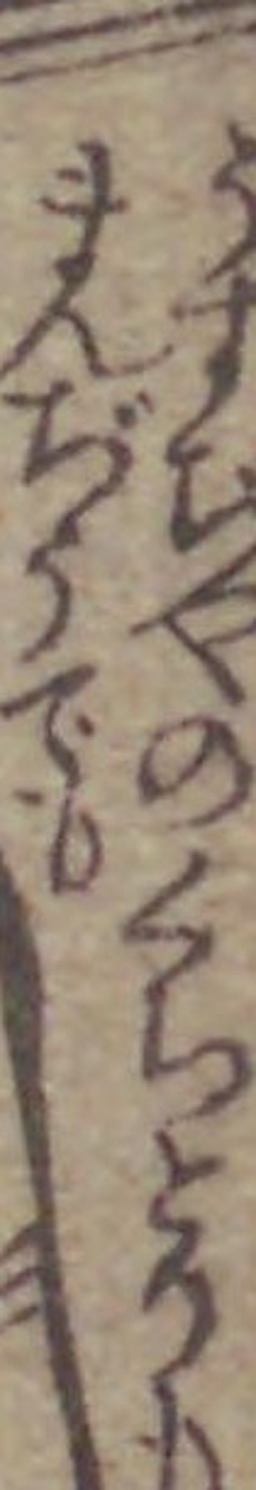まんぢうでも
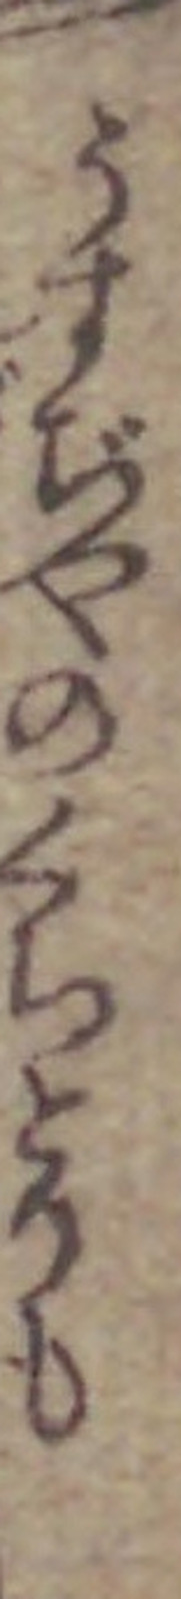うすぢやのくちとりも
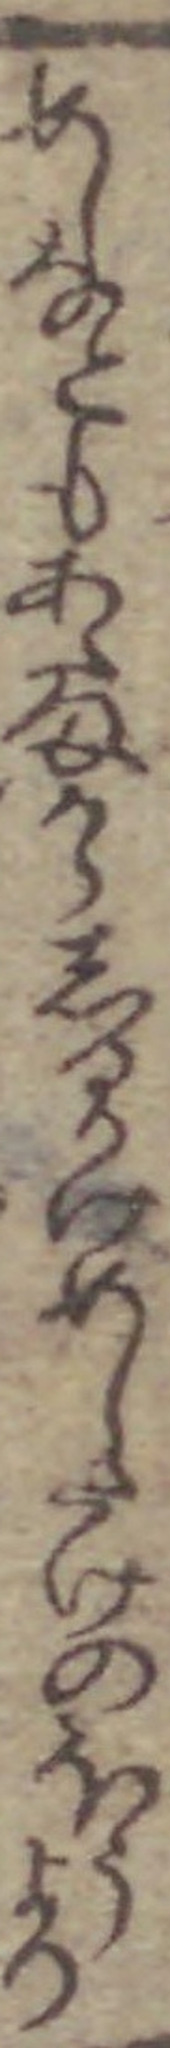めしなともあたまからしるかけめしさけのほうより
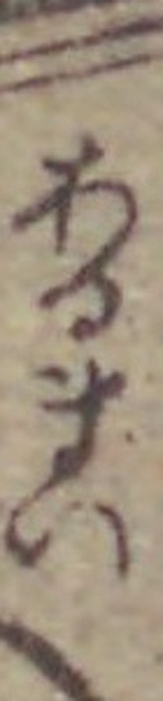あるまい
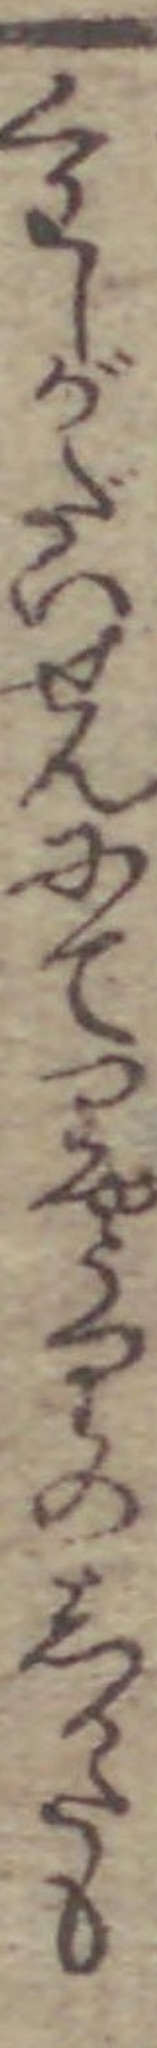くわしがだいせんにてりやうりのしかたも
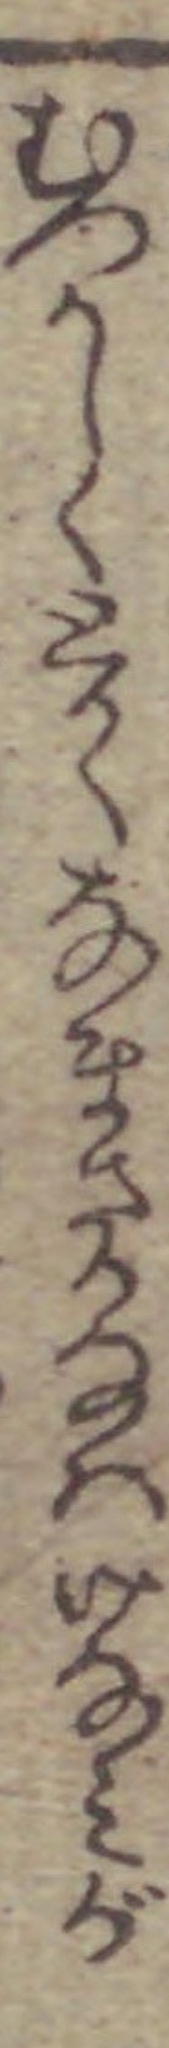むつかしくとかくなまさかなはけなみが
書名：狆の嫁入 2巻
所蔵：国立国会図書館 National Diet Library, JAPAN
